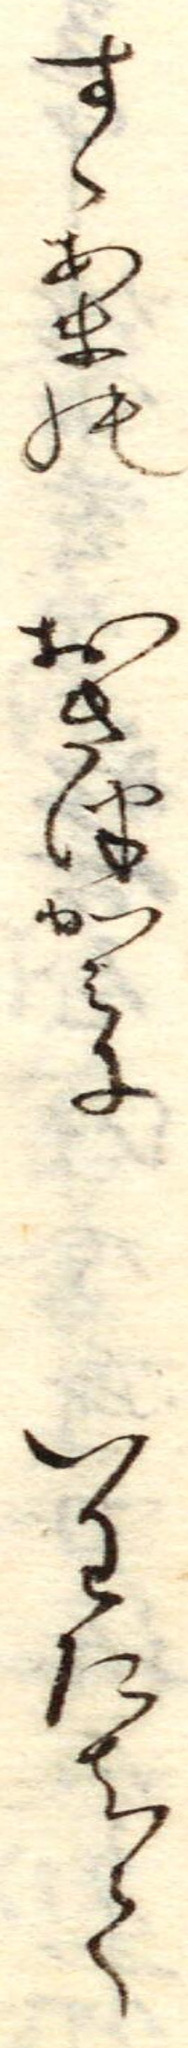すゝあまのおき津かみにいわたちて
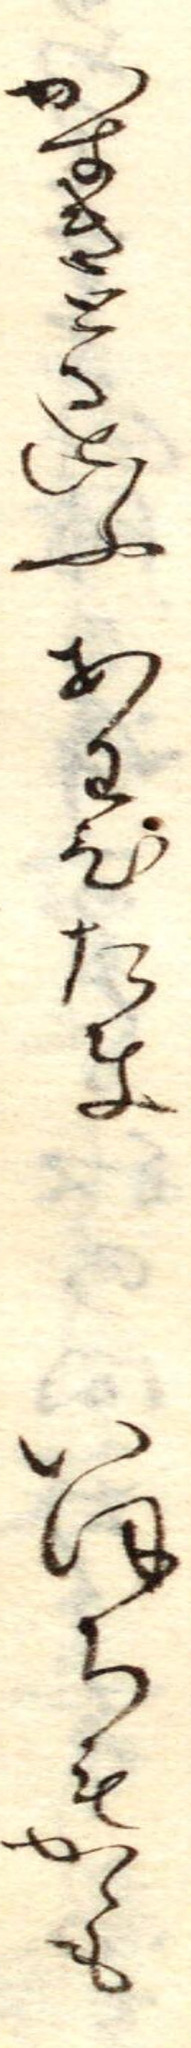かすきとるといふあわひたまいほちもかも
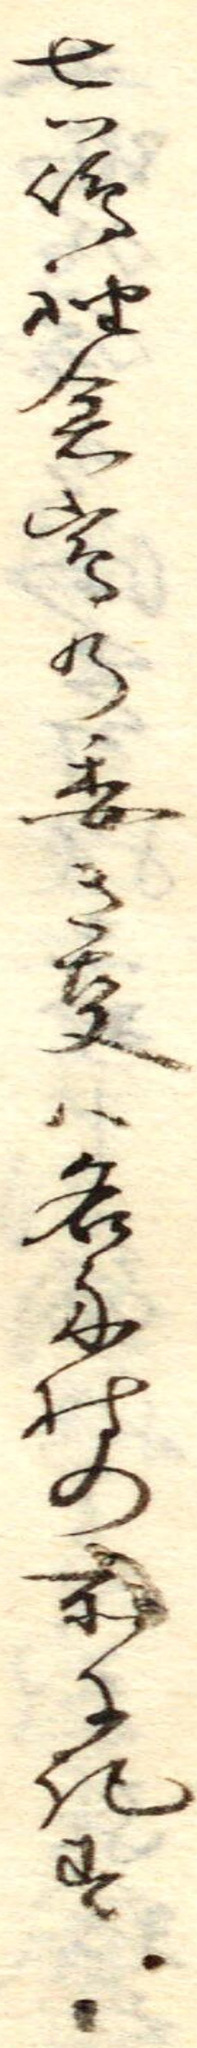七ッ嶋舳倉嶌の委き事は名舟村の所に記す

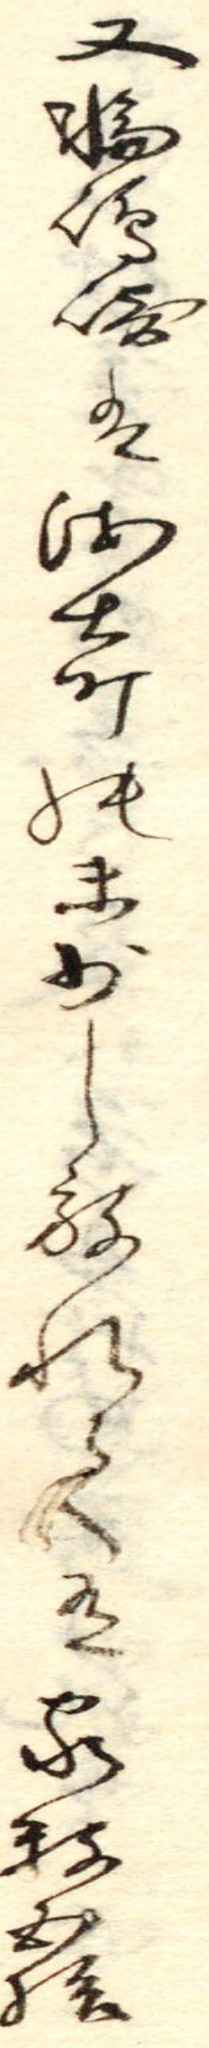又輪嶋崎は海士町の未少し放れて有家数五拾
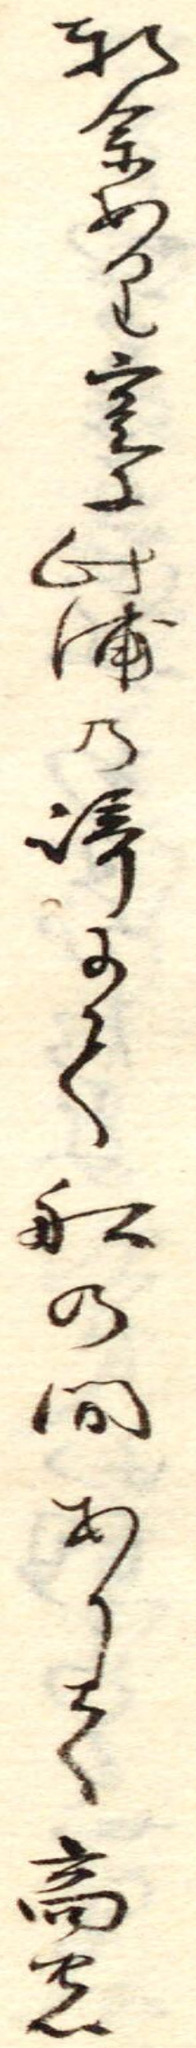軒余あり寔に此浦の崎にて船の間ありて高の
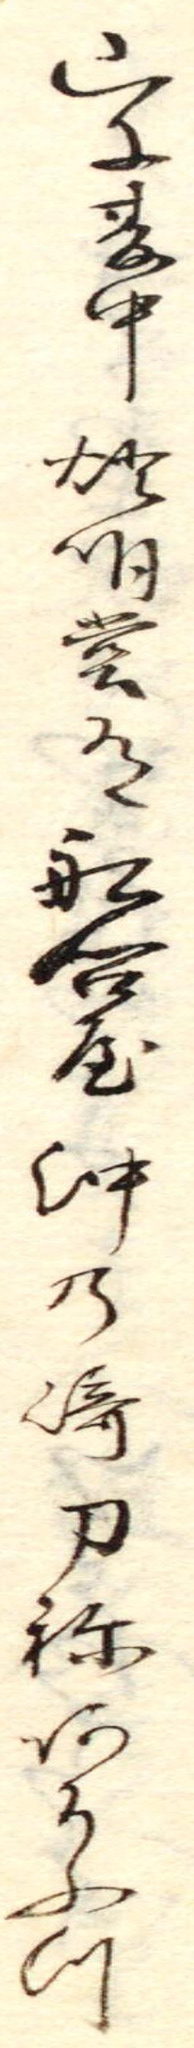山に夏中燈明堂有船問屋沖の崎刀祢あうふつ
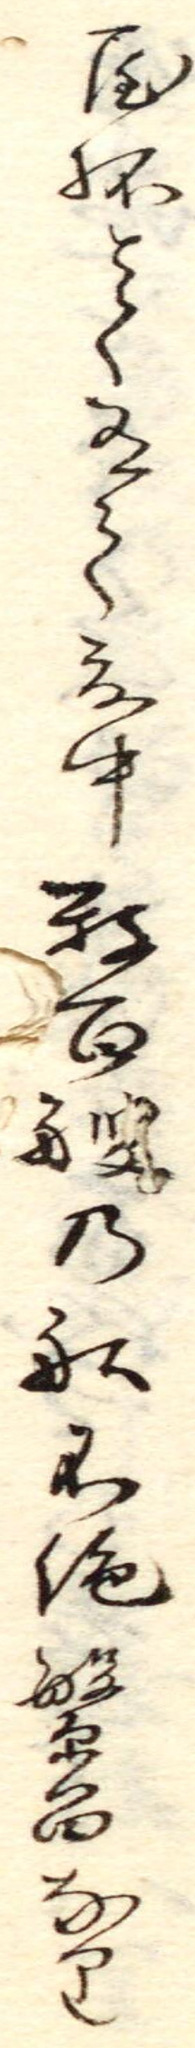屋抔とて有之夏中数百艘の船不絶繁昌なり
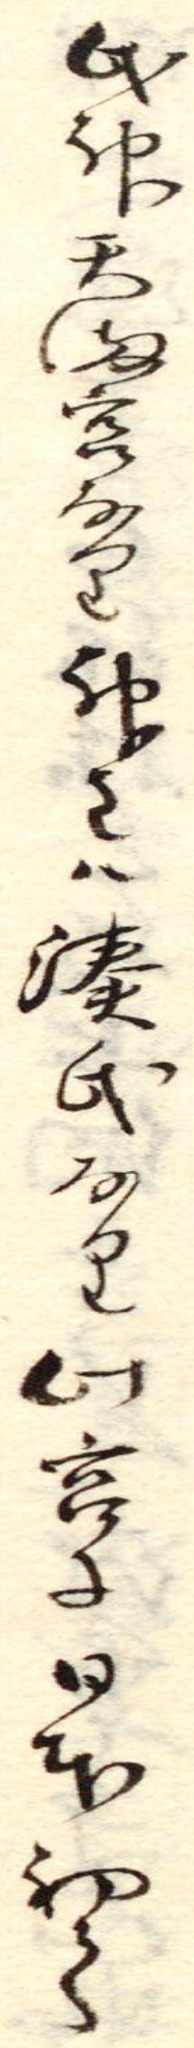氏神天満宮なり神主は湊氏なり此宮に日本初て
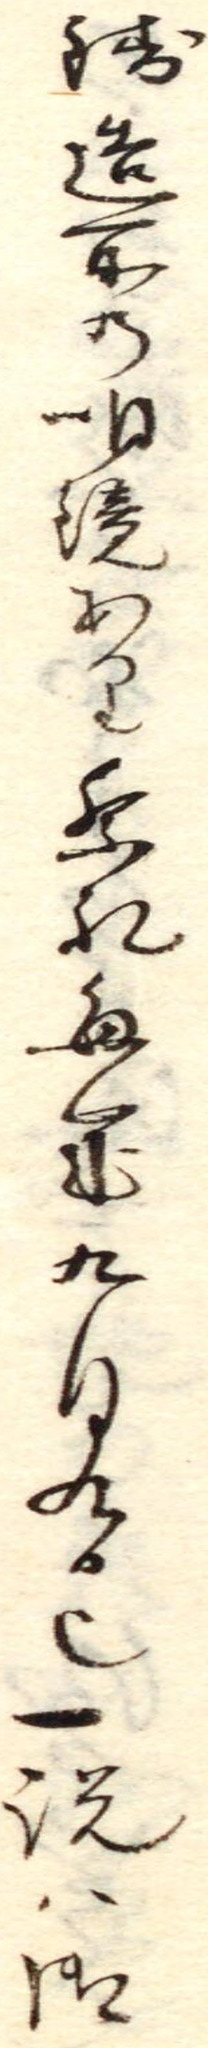鋳造所の明鏡あり祭礼毎歳九月九日也一説は御
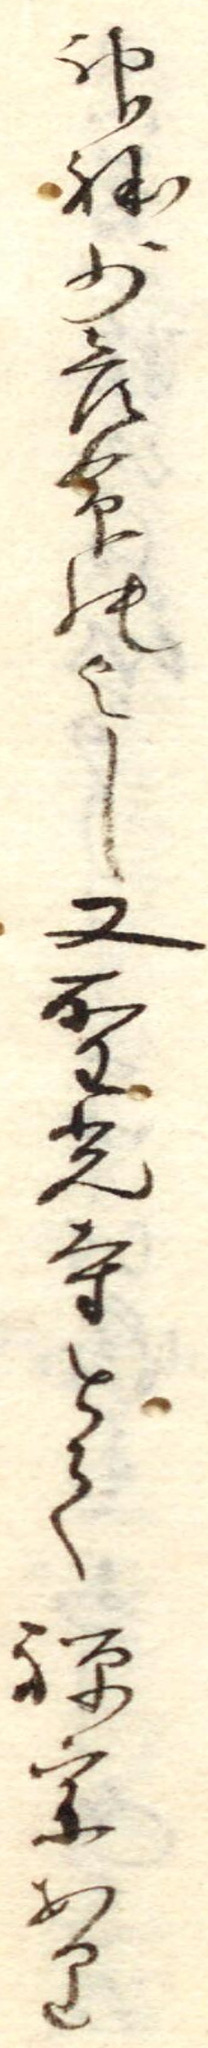神躰少彦命のよし又聖光寺とて禅宗あり
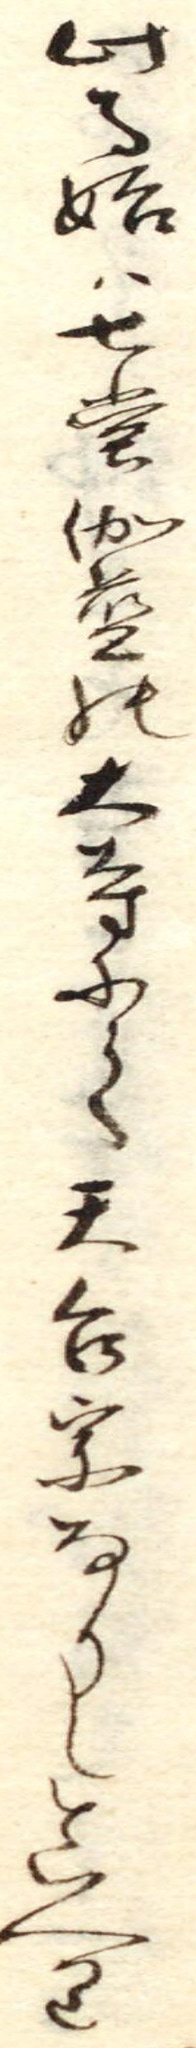此寺始は七堂伽藍の大寺にて天台宗なりしといへり
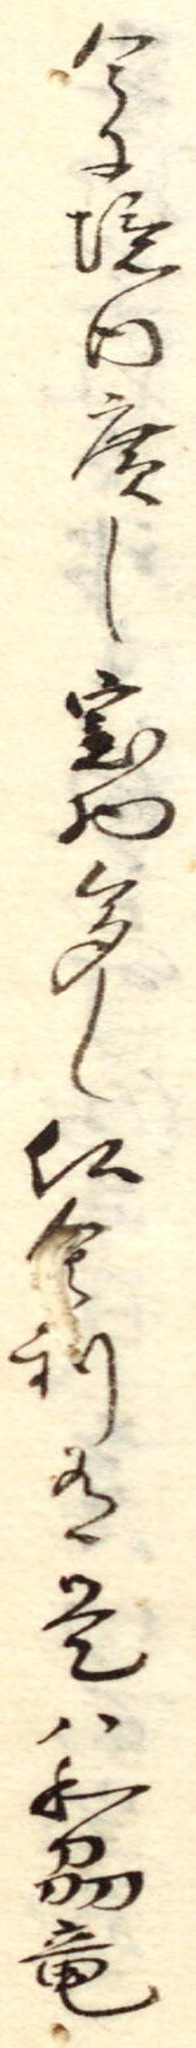今に境内広し宝物多し仏舎利有是は和州竜
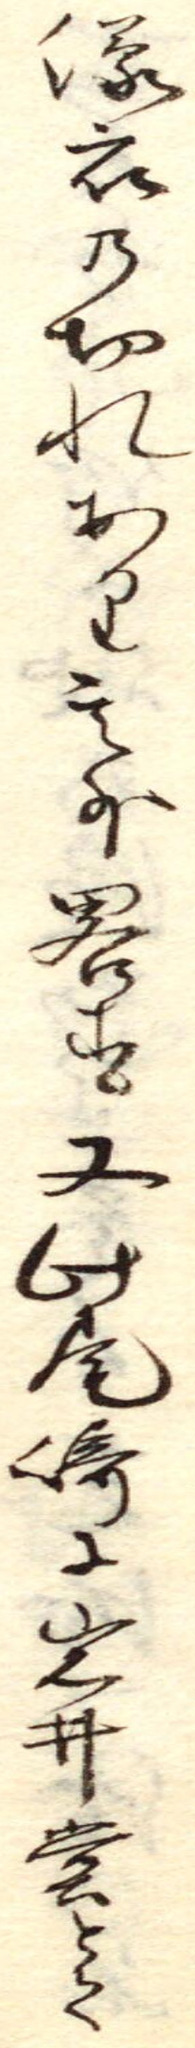像衣の切れあり其外略す又此尾崎に岩井堂とて
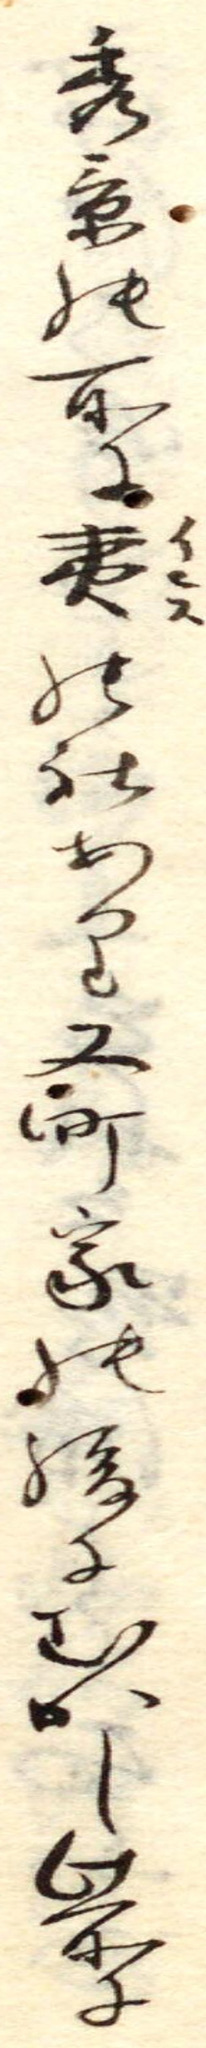秀景の所に夷の社あり又町家の後にむかし此所に
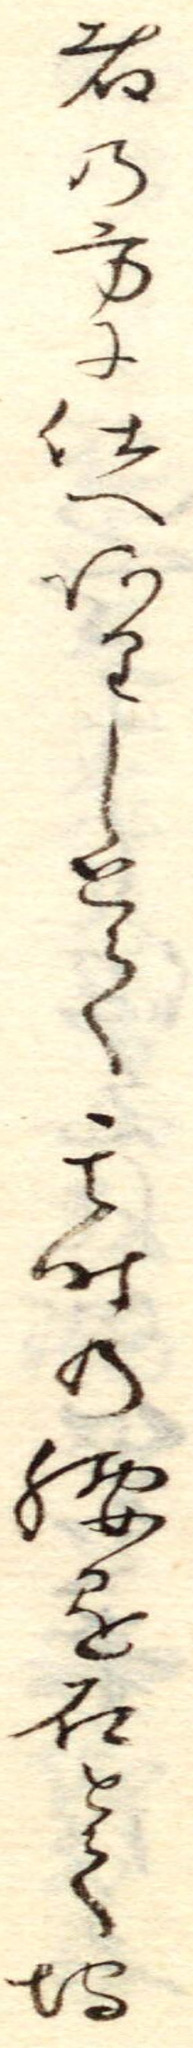者の方に仕へありしとて其時の腰懸石とて埒
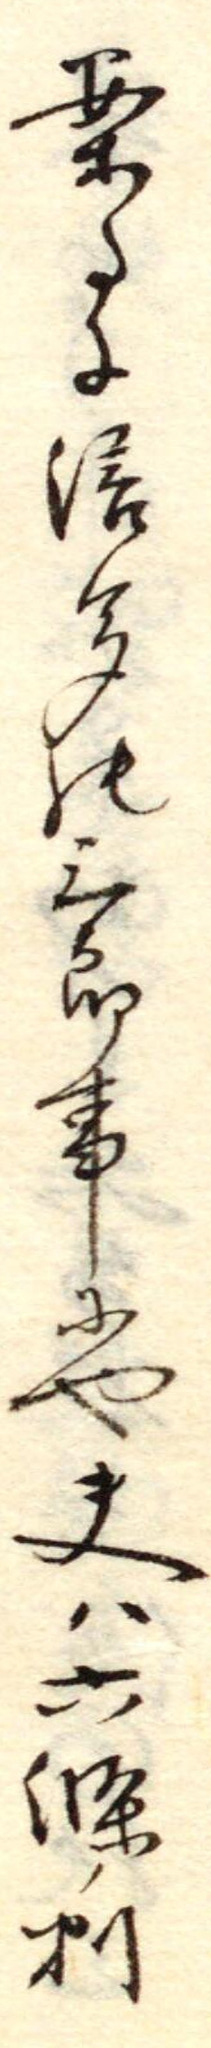案るに信多の三郎事にや夫は六条ノ判
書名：能登名跡誌
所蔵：Ishikawa Prefectural Library
